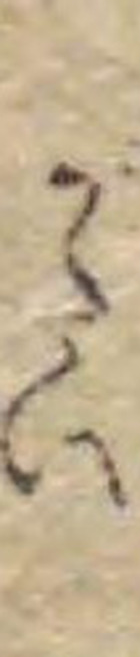がたい
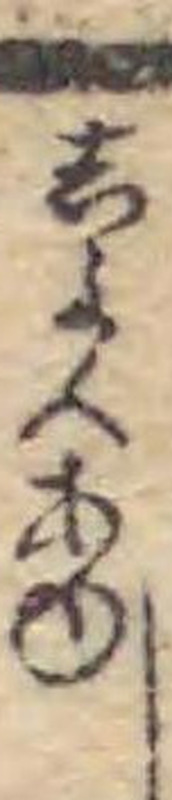しよ人あゆ
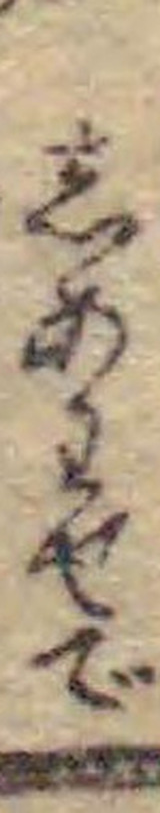しあわせで
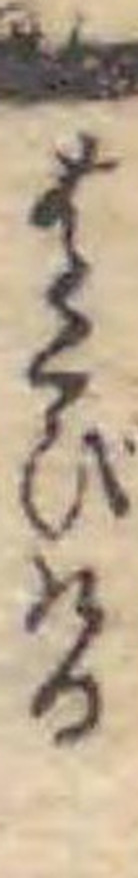はこびける
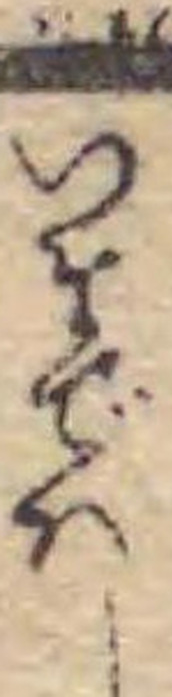いまでは
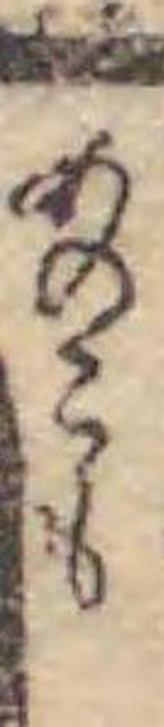あのこも
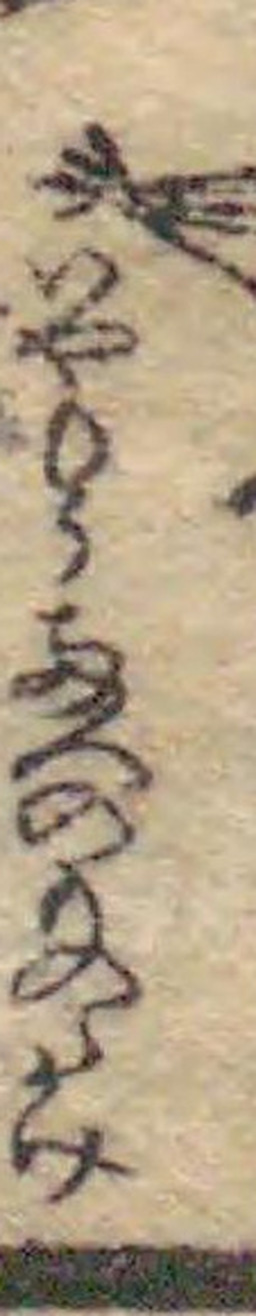いやもう両人のものけ
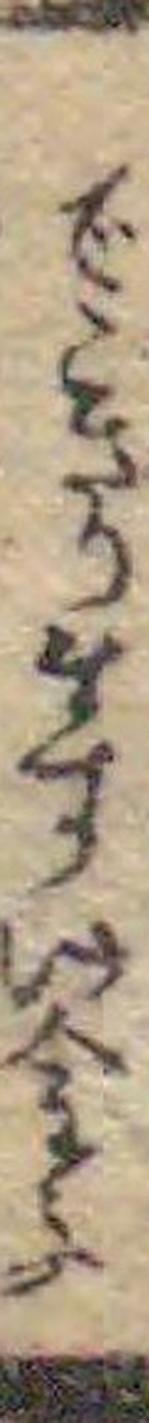でござります此金子
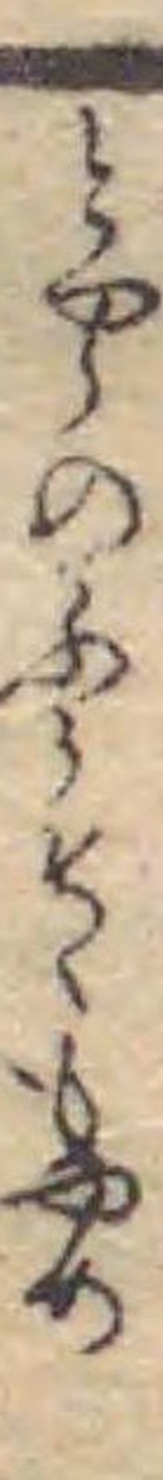とやらのふうそくもやめ
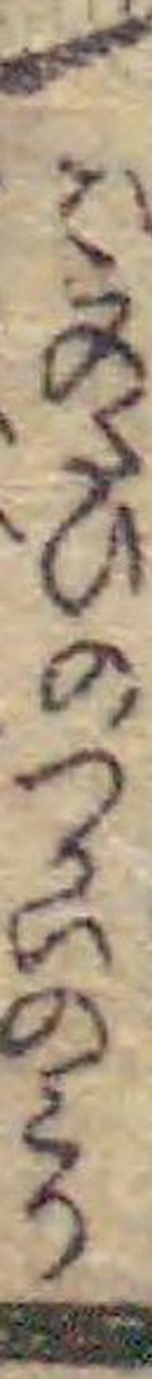はこのたひのつかいのこり
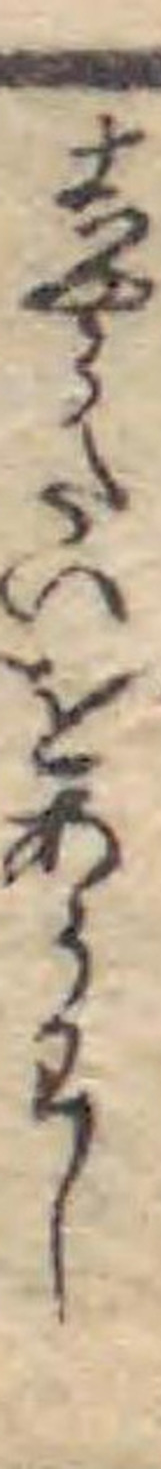しやうたいをあらわし
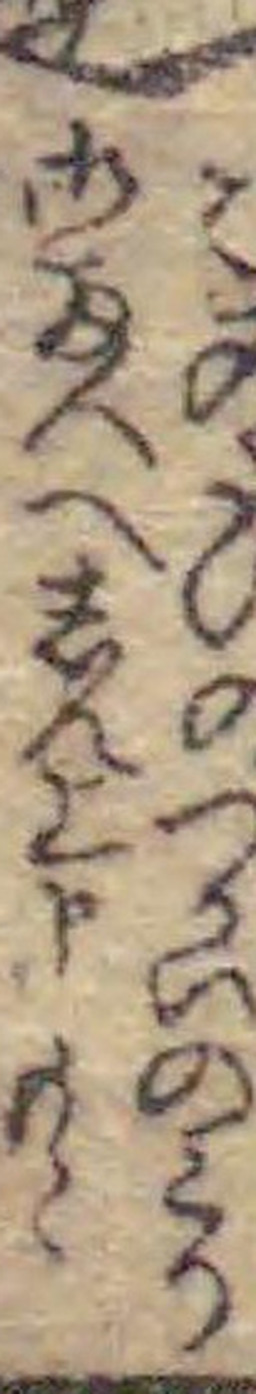御両人へしん上申もと
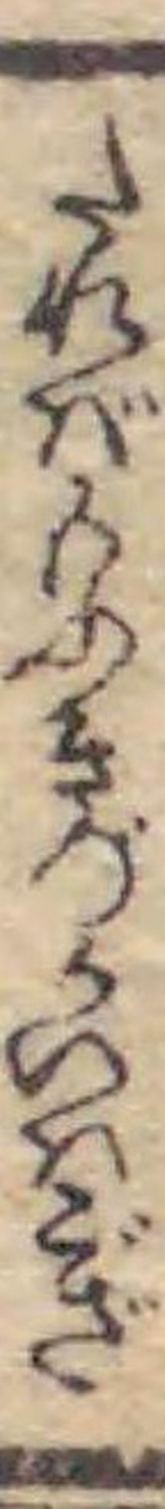たればもふきづかいはござ
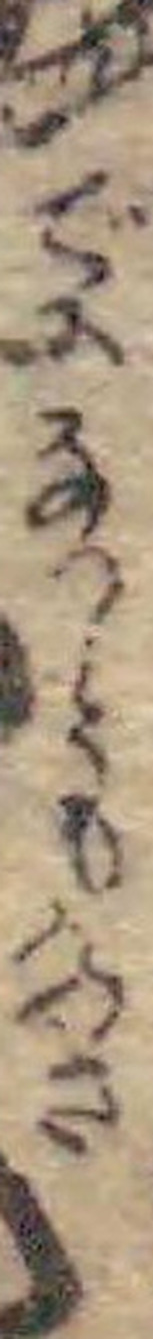でになりともなさ
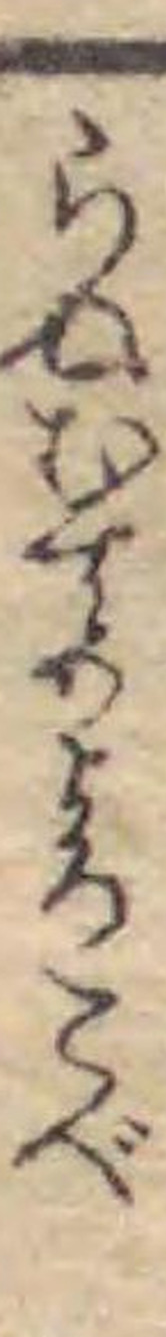らぬむすめよろこべ
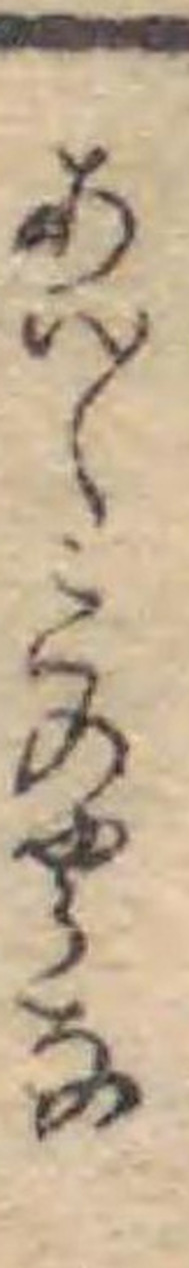あい〳〵このやうな
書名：扨化狐通人 : 2巻
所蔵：国立国会図書館 National Diet Library, JAPAN
